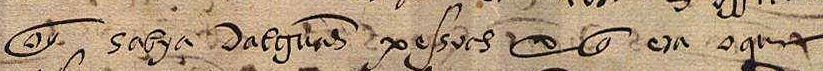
o q̄ sabya dalgūas pessoas e q̄ era o que
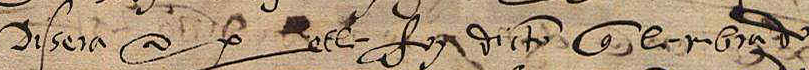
dissera q̄ ꝑ elle foy dic̄to q̄ lembrado
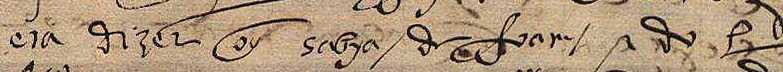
era dizer o q̄ sabya de foam/ e do Ldo
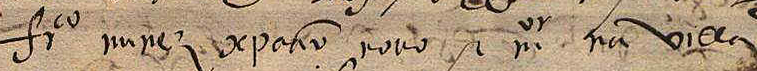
frco nunez xpaão nouo e mor na villa de
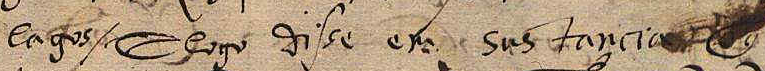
lagos / e logo disse em sustancia q̄
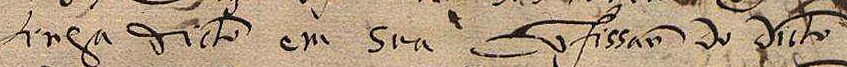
tinha dic̄to em sua Cōfissão do dīcto
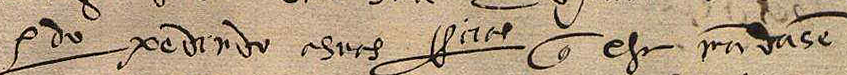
Ldo pedindo a suas Rcias q̄ lhe mādas̄e
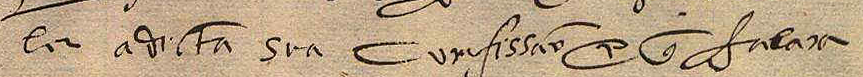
ler a dic̄ta sua Comfissão ē q̄ falara
